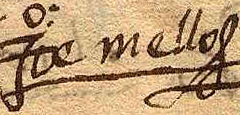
Jo de mello
